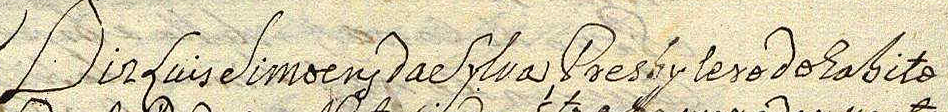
Diz Luis Simoens da Sylva, Presbytero do habito
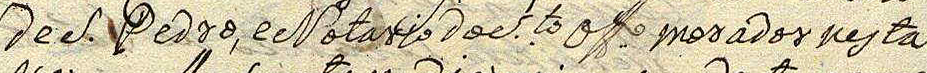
de S. Pedro, e Notario do S.to Off.o morador nesta
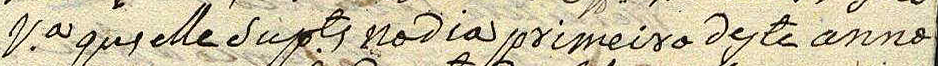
V.a que elle sup.te no dia primeiro deste anno
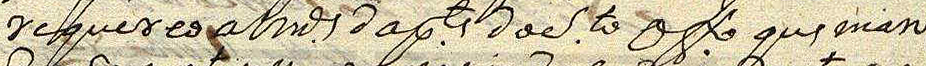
requereo a v m.e da p.te do S.to off.o que man
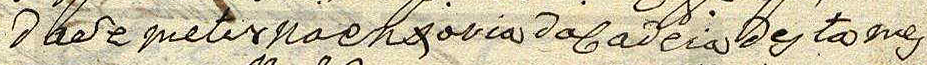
dase meter na enxovia da Cadeia desta mes
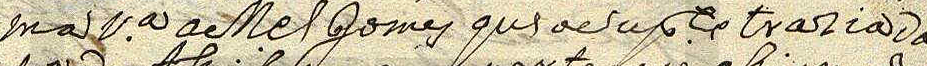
ma V.a a M.el Gomes que o sup.te trazia da
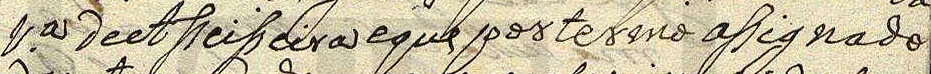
V.a de Asseisseira e que por termo assignado
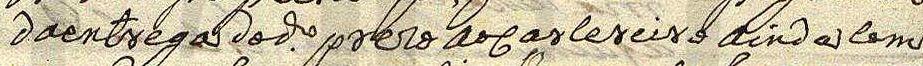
da entrega do d.o prezo ao Carcereiro ainda com
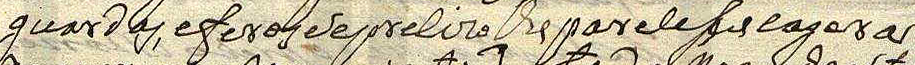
guardas, e feros se precizo lhe parecesse e agora
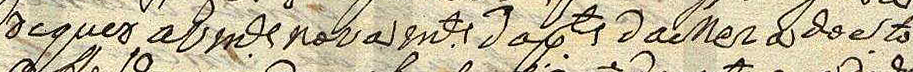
de quer a v m.e novam.te da p.te da Meza do S.to
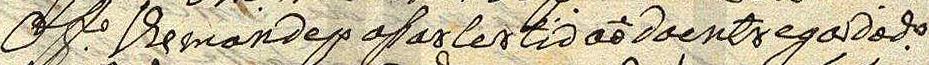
Off.o lhe mande passar Certidaõ da entrega do d.o
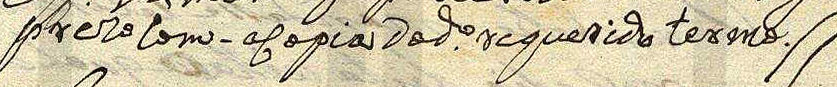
prezo com a Copia do d.o requerido termo.//
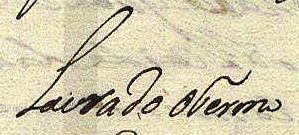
Lavrado o Termo
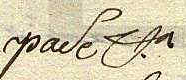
pase V.a
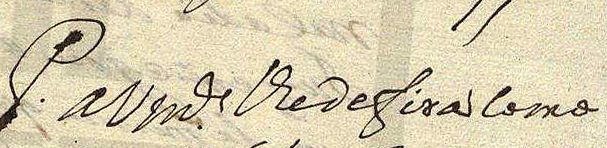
P. a v m.e lhe defira como
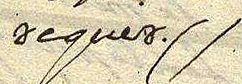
requer.//
